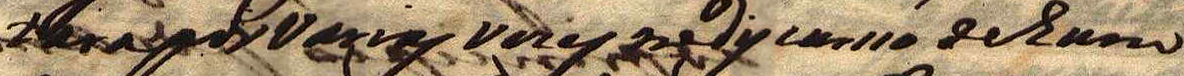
tara por varias vezes no discursso de hum
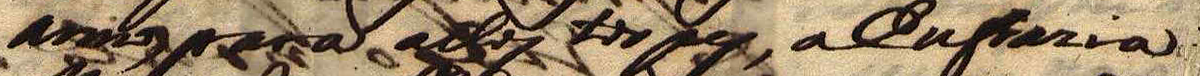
anno para actos torpes, a Eufrazia
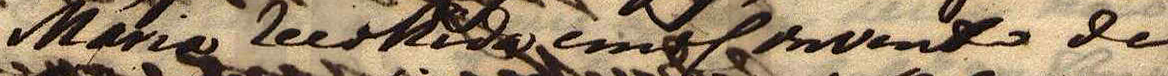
Maria Recolhida em o Convento de
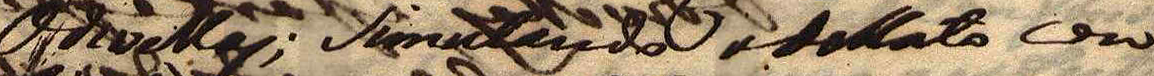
Odivellas; simulando o Dellato con
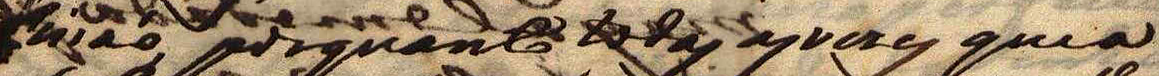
fissaõ porquanto todas as vezes que a
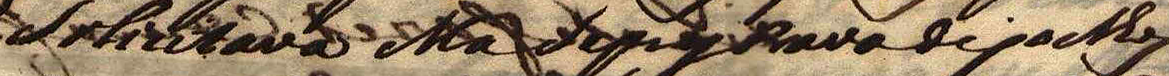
solicitava ella se prostrava de joelhos
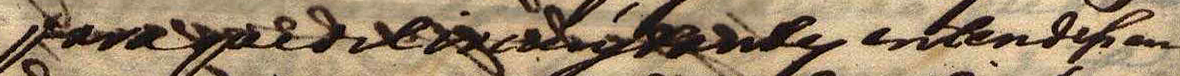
para que os circunstantes entendessem
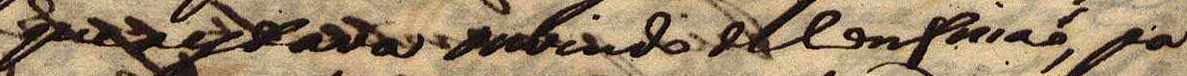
que a estava ouvindo de confissaõ, pa
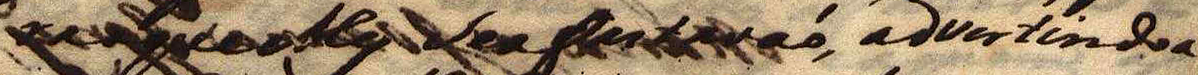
ra que elles se afastavaõ, advertindoa
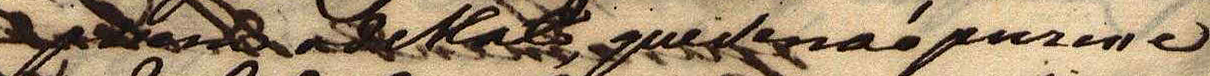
porem o dellato, que se naõ puzesse
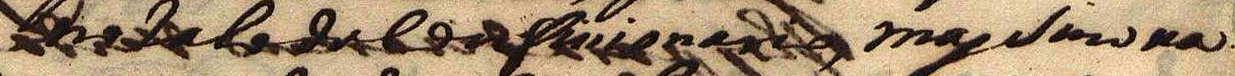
no Ralo do Confissionario, mas sim na
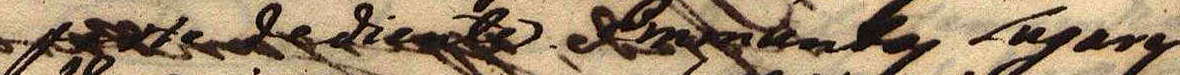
parte de diante e em muntos Lugares
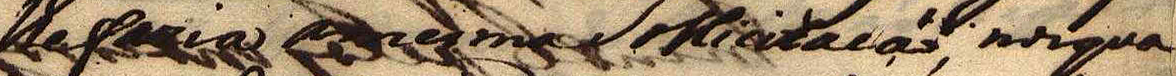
lhe fazia a mesma sollicitação; nos qua
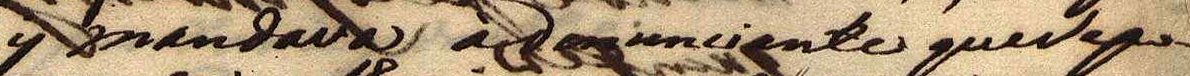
es mandava a denunciante que se po
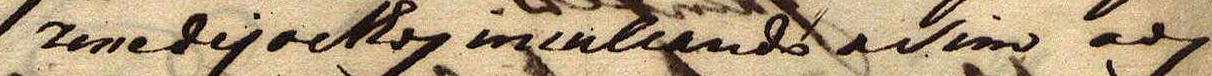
zesse de joelhos inculcando asim aos
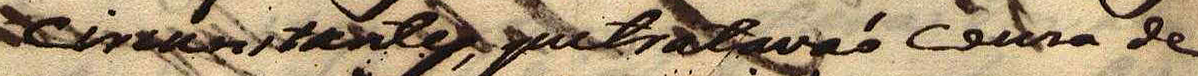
circunstantes, que tratavaõ couza de
